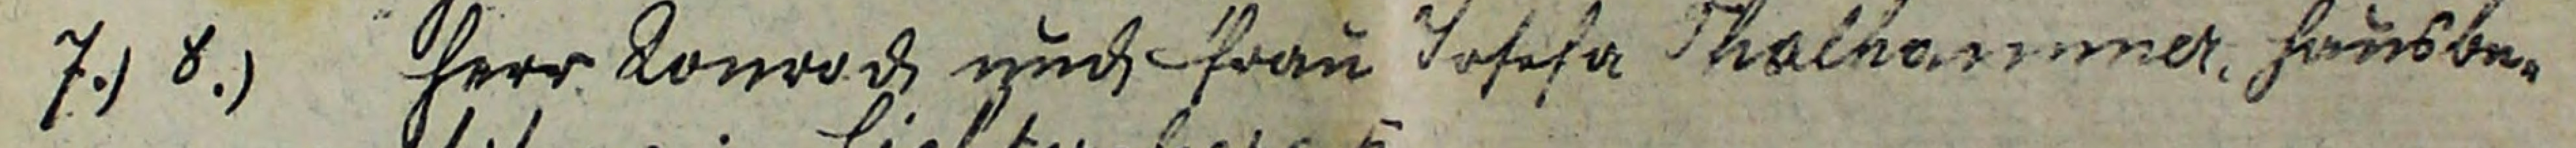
7.) 8.) Herr Konrad und Frau Josefa Thalhammer, Hausbe„
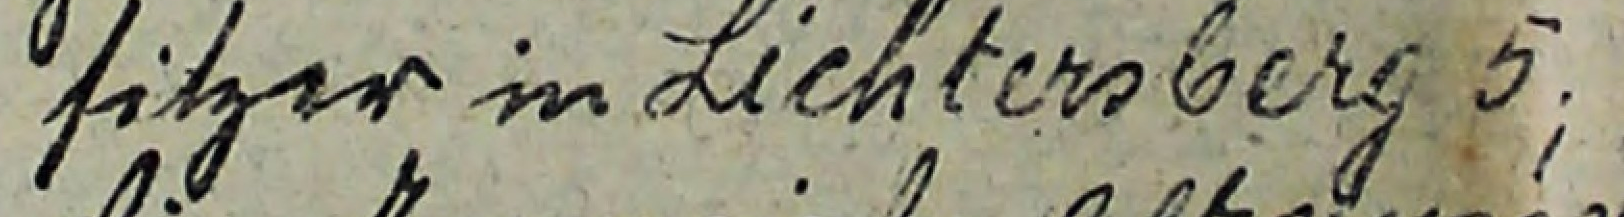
sitzer in Lichtersberg 5;
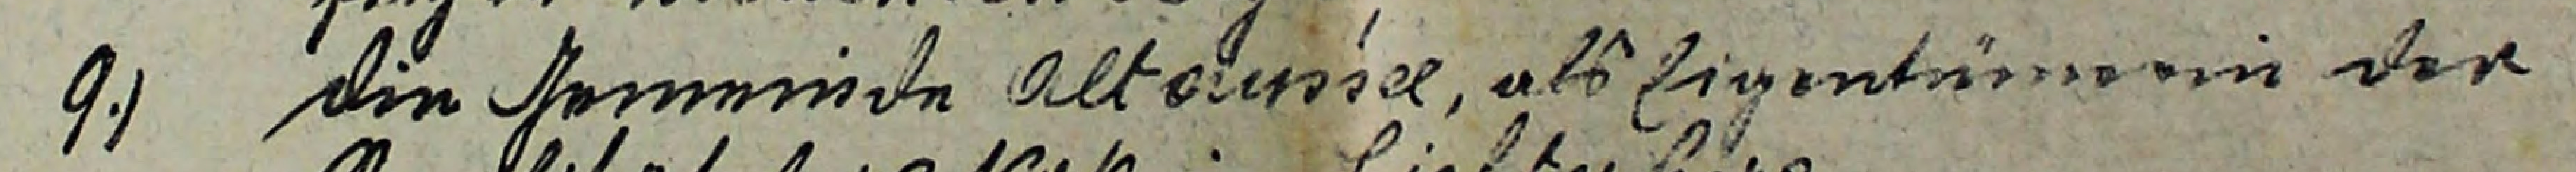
9.) Die Gemeinde Altaussee, als Eigentümerin der
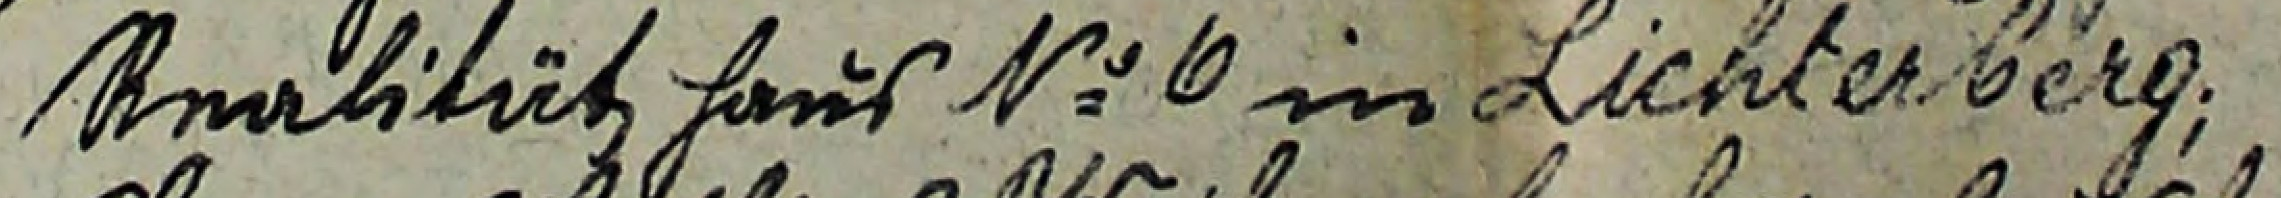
Realität Haus No 6 in Lichterberg;
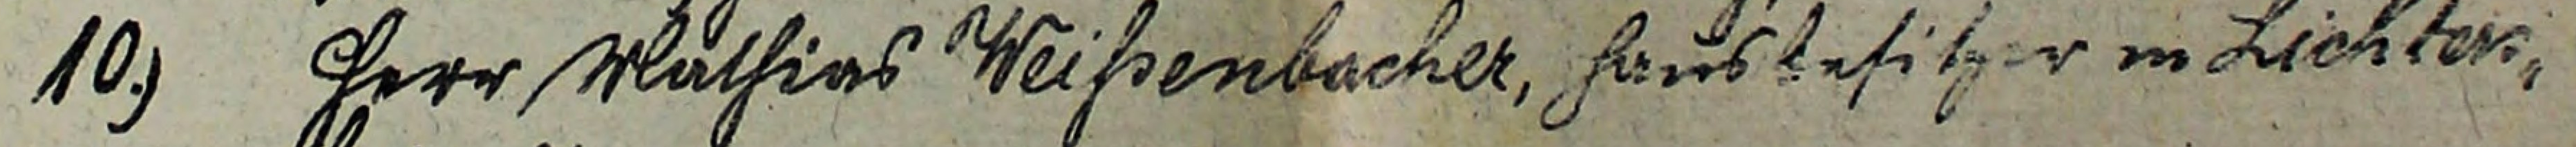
10.) Herr Mathias Weissenbacher, Hausbesitzer in Lichter„
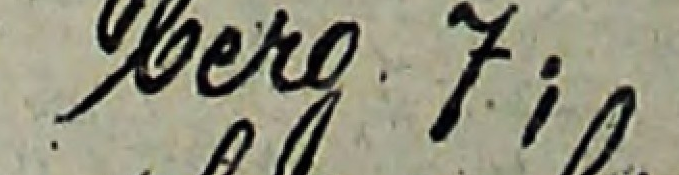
berg 7;
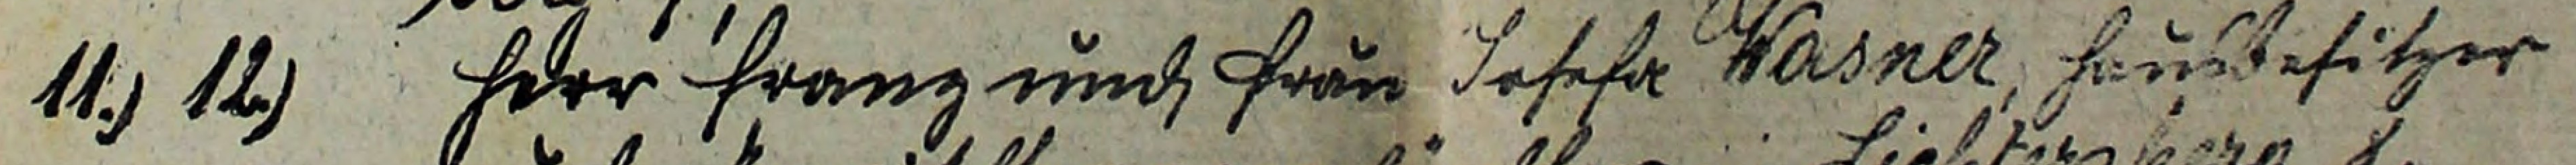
11.) 12.) Herr Franz und Frau Josefa Wasner, Hausbesitzer
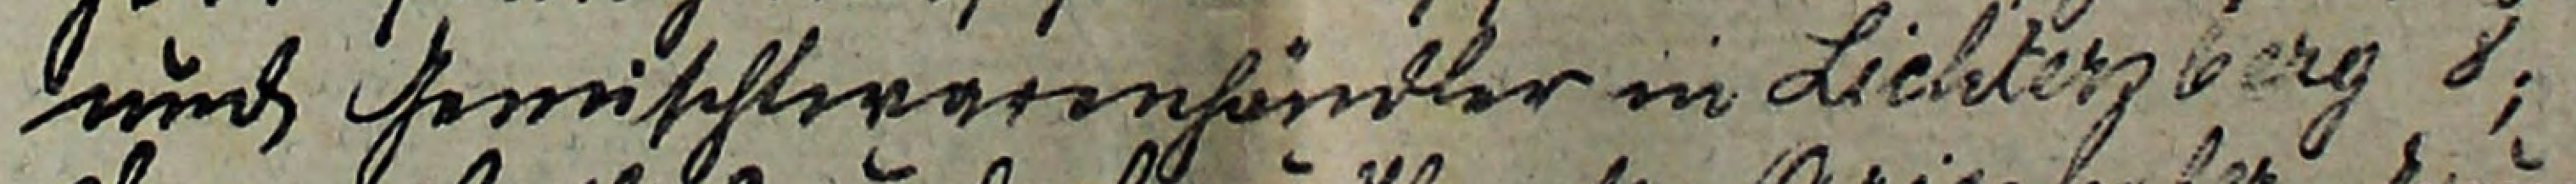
und Gemischtwarenhändler in Lichterzberg 8;
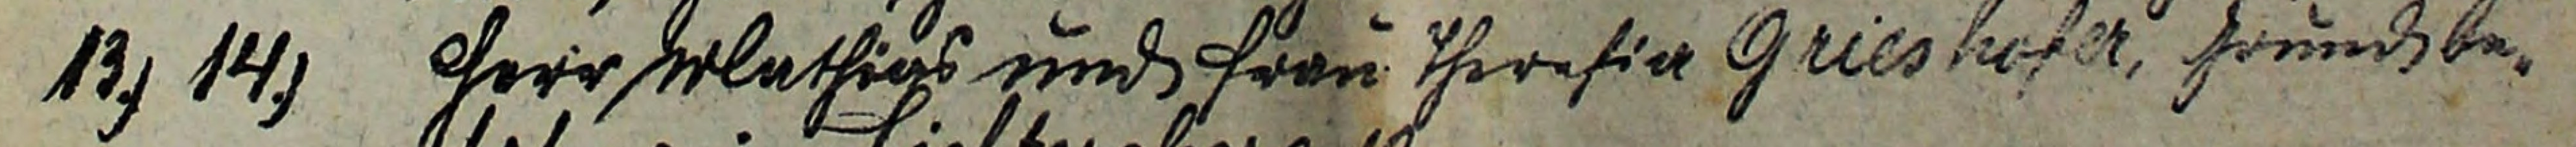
13.) 14.) Herr Mathias und Frau Theresia Grieshofer, Grundbe„
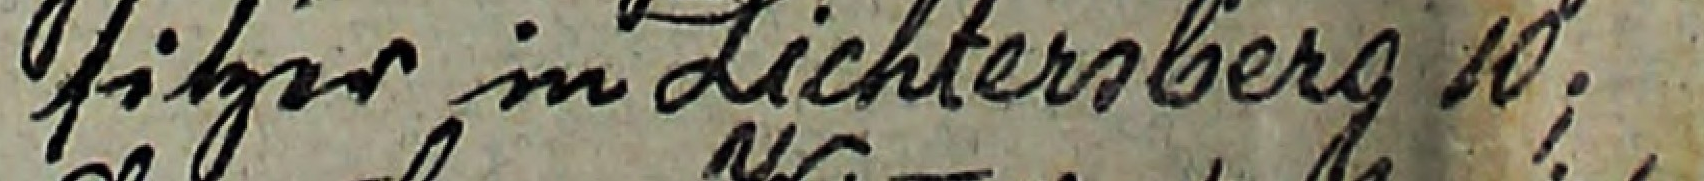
sitzer in Lichtersberg 10;
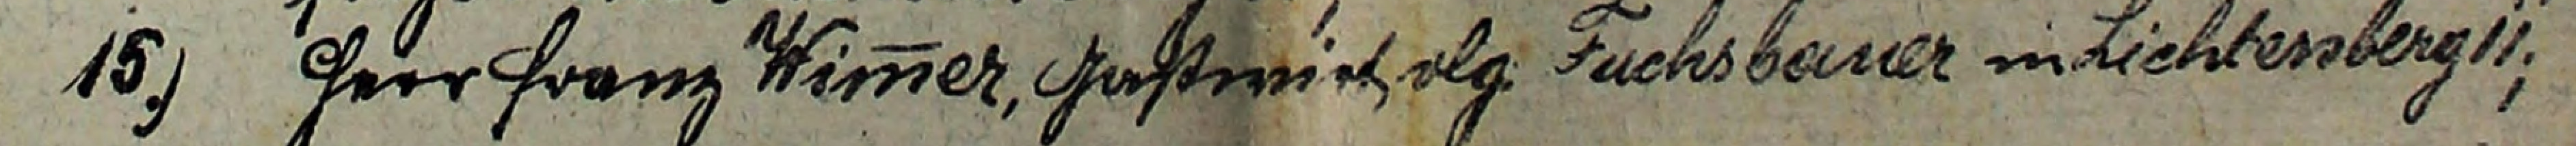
15.) Herr Franz Wimmer, Gastwirt vlg. Fuchsbauer in Lichtersberg 11;
